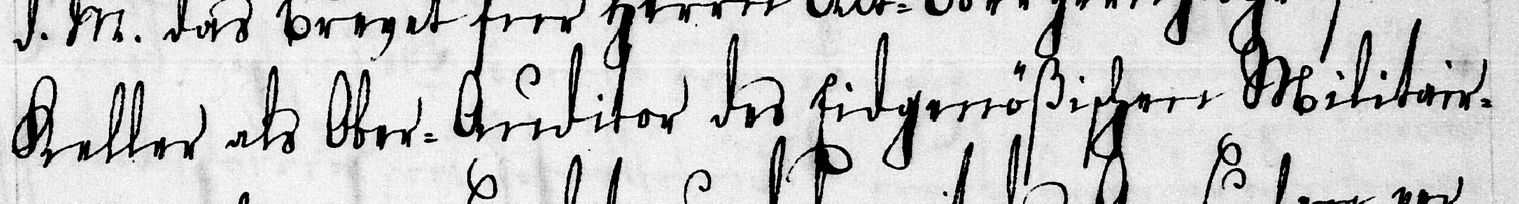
Keller als Ober-Auditor des Eidgenößischen Militair-J¬
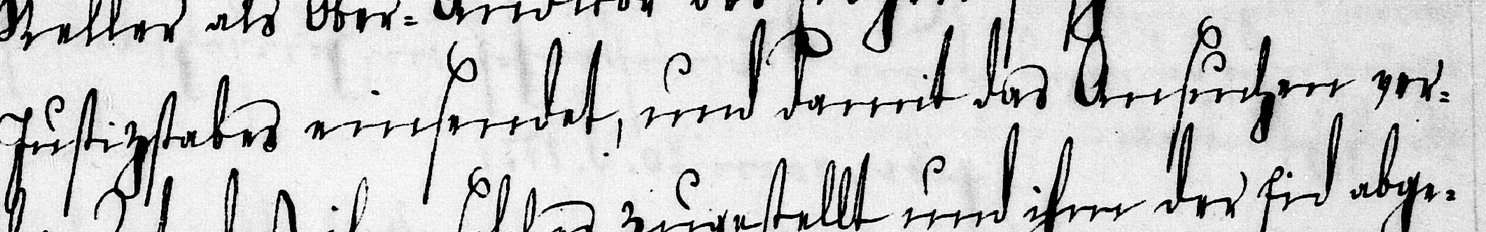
ustizstabes einsendet, und damit das Ansuchen ver¬
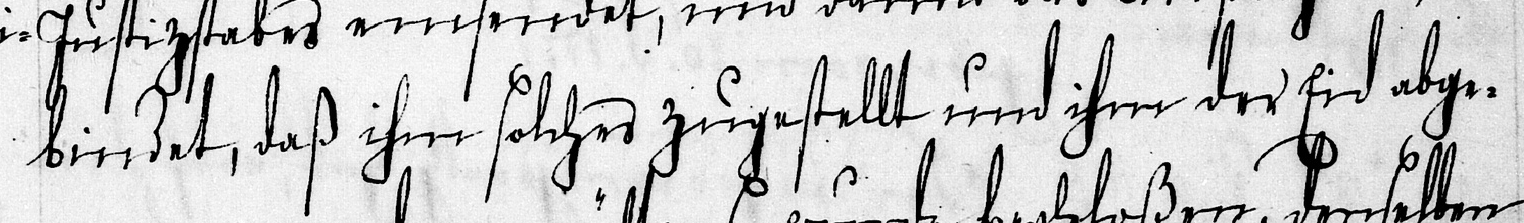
bindet, daß ihm solches zugestellt und ihm der Eid abge¬
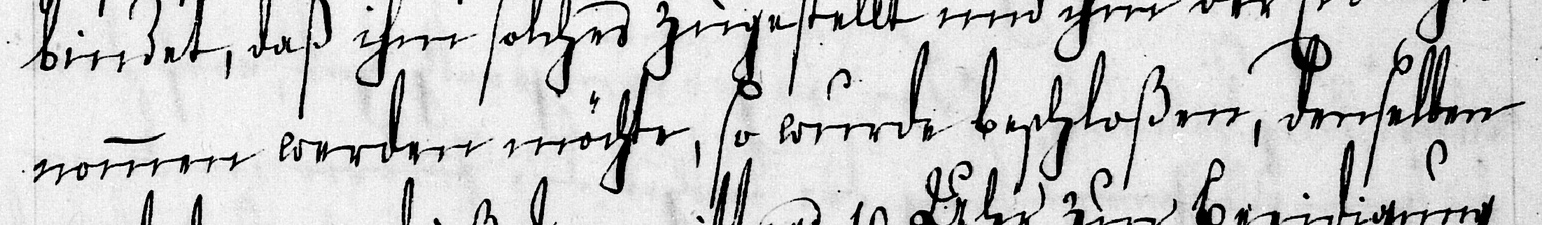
nommen werden möchte, so wurde beschloßen, denselben
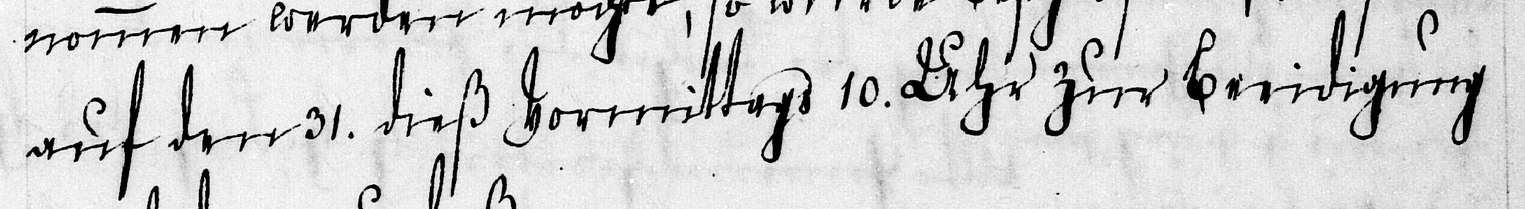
auf den 31. dieß Vormittags 10. Uhr zur Beeidigung
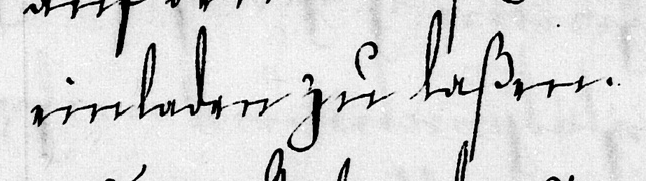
einladen zu laßen.
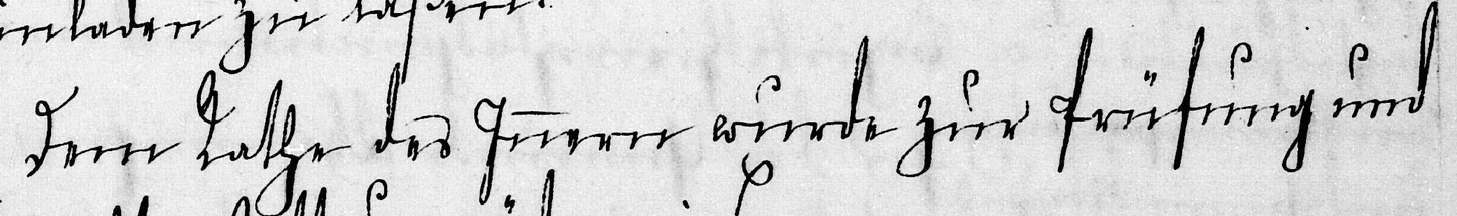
Dem Rathe des Innern wurde zur Prüfung und
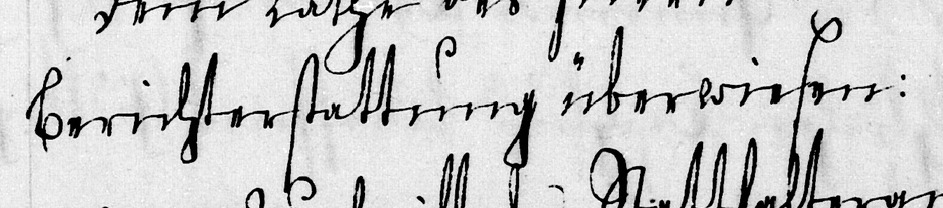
Berichterstattung überwiesen:
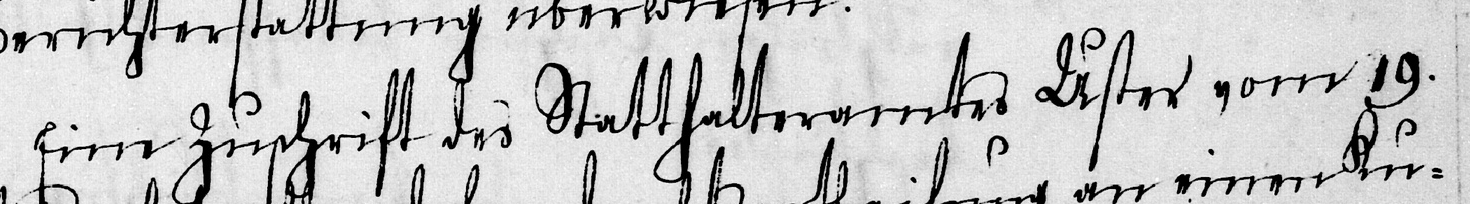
Eine Zuschrift des Statthalteramtes Uster vom 19.
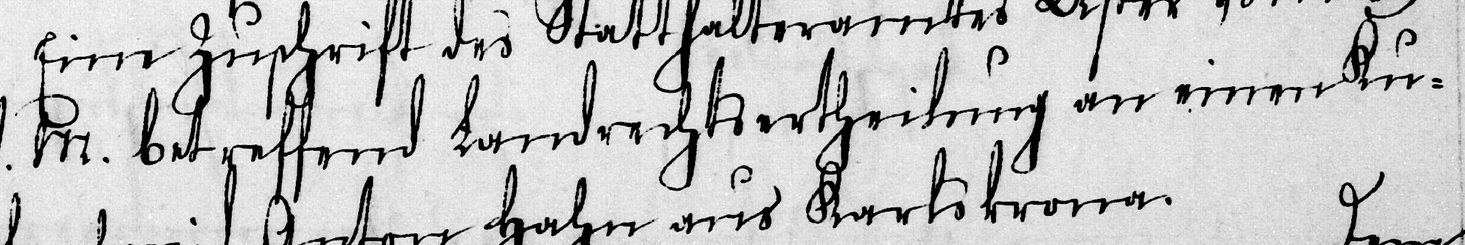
M. betreffend Landrechtsertheilung an einen Ku¬
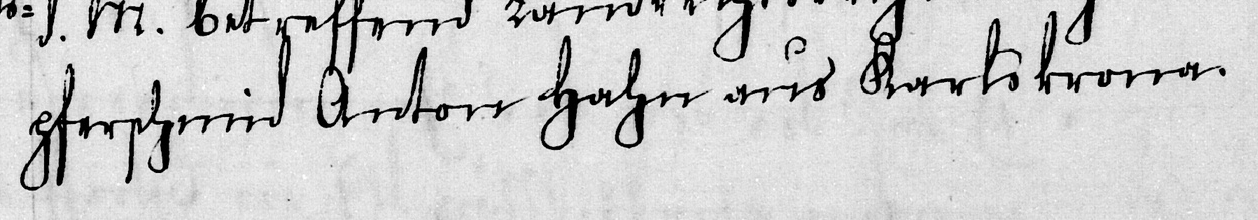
pferschmid Anton Hahn aus Karlskrona.
